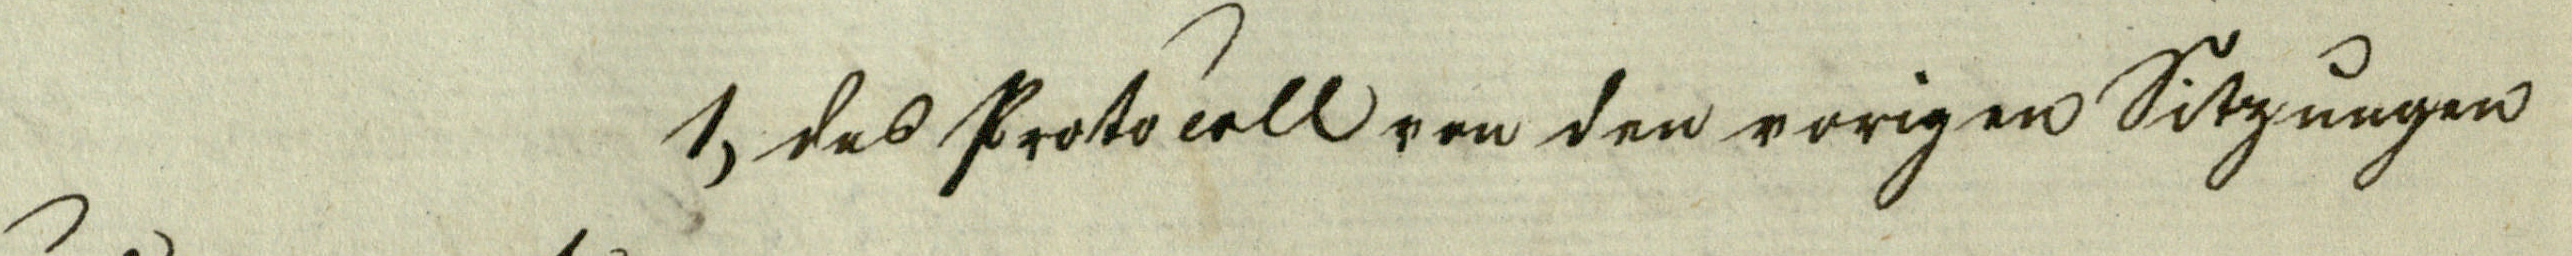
1, das Protocoll von den vorigen Sitzungen
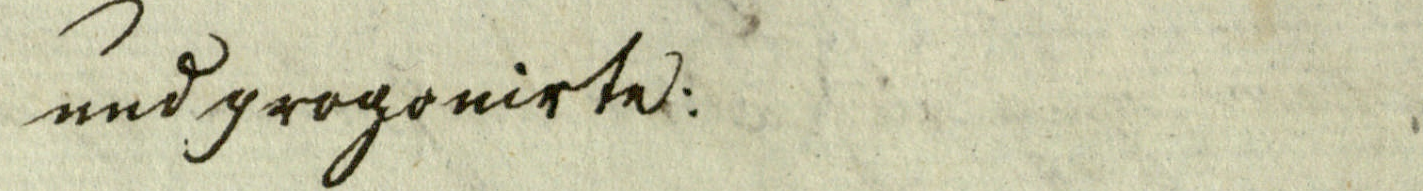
und proponirte:
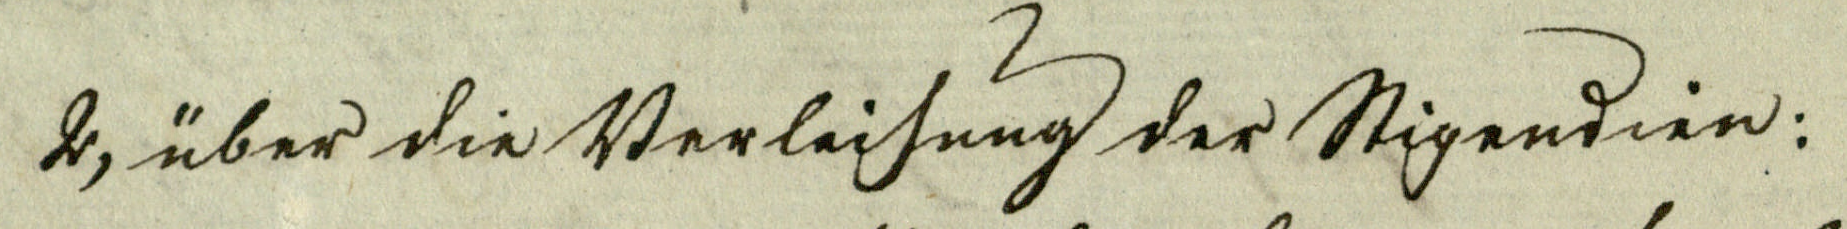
2, über die Verleihung der Stipendien:
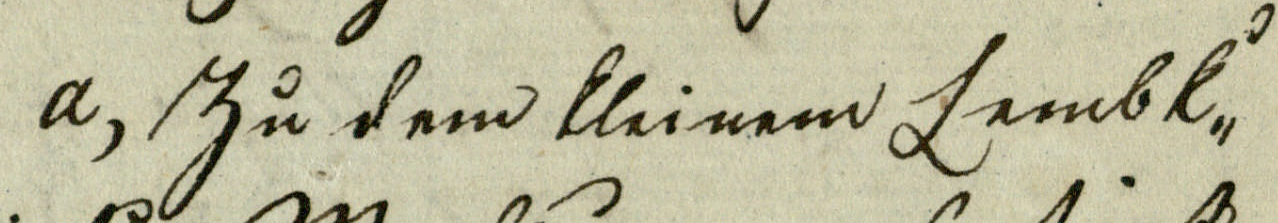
a, Zu dem kleinen Lembk'
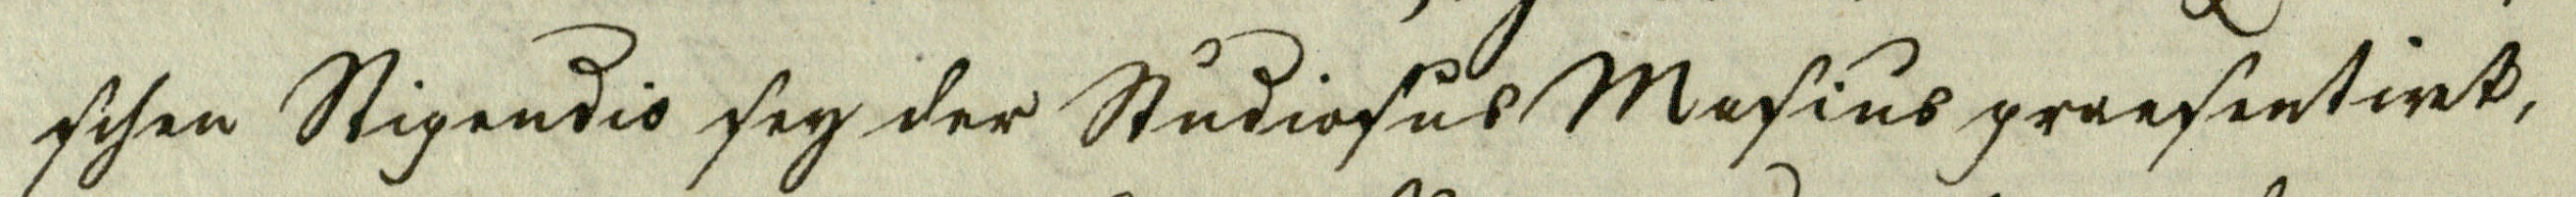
schen Stipendio sey der Studiosus Masius praesentiret,
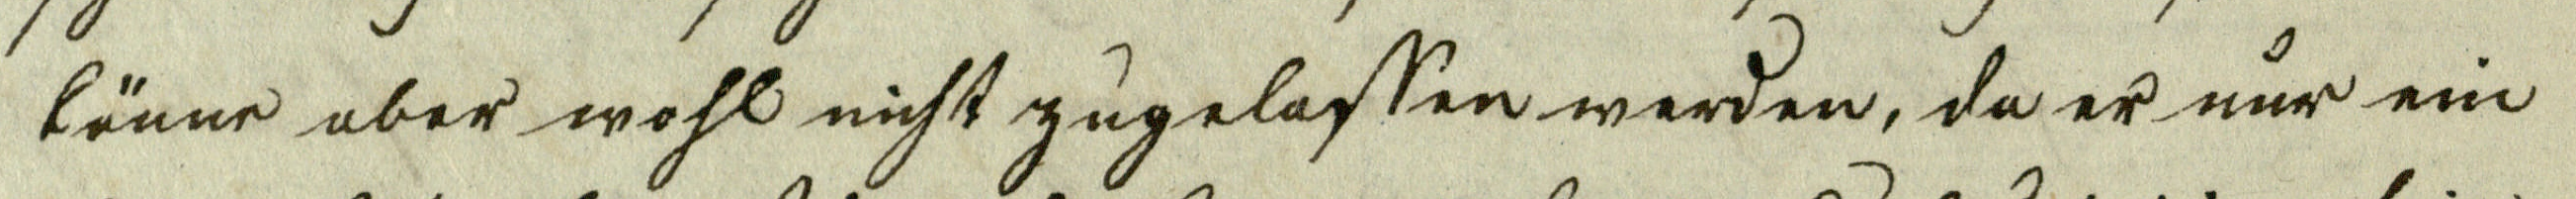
könne aber wohl nicht zugelassen werden, da er nur ein
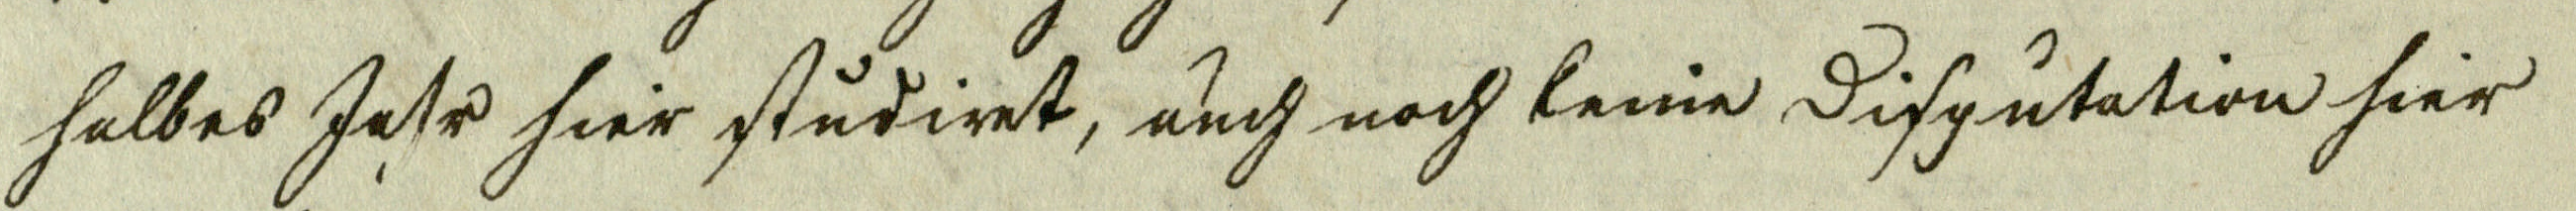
halbes Jahr hier studiret, auch noch keine Disputation hier
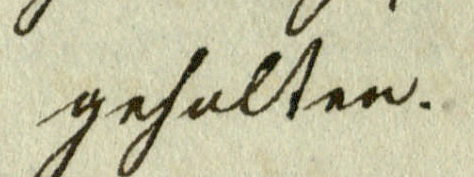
gehalten.
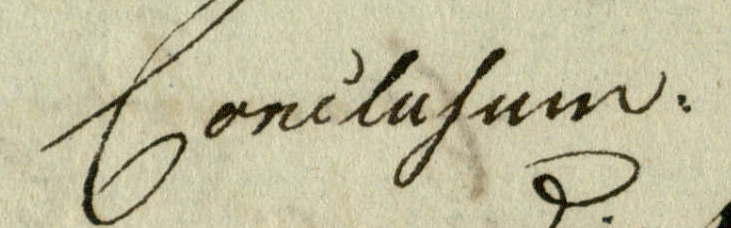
Conclusum:
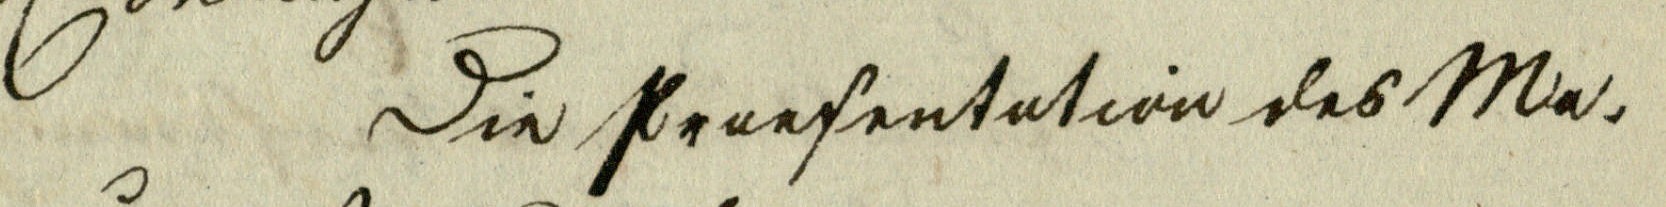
Die Praesentation des Ma¬
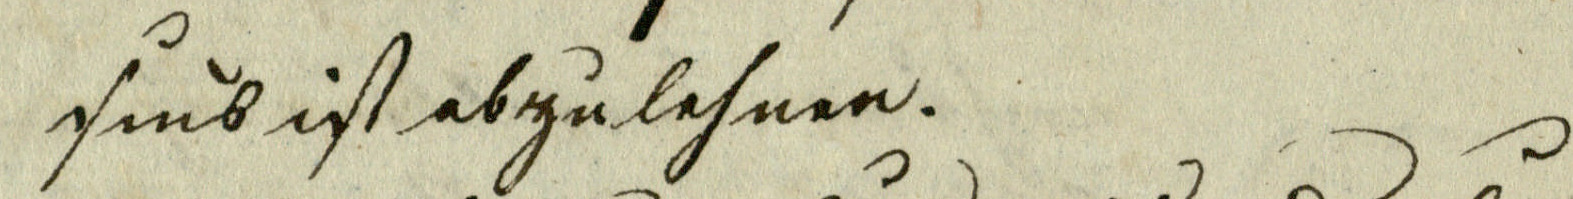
sius ist abzulehnen.
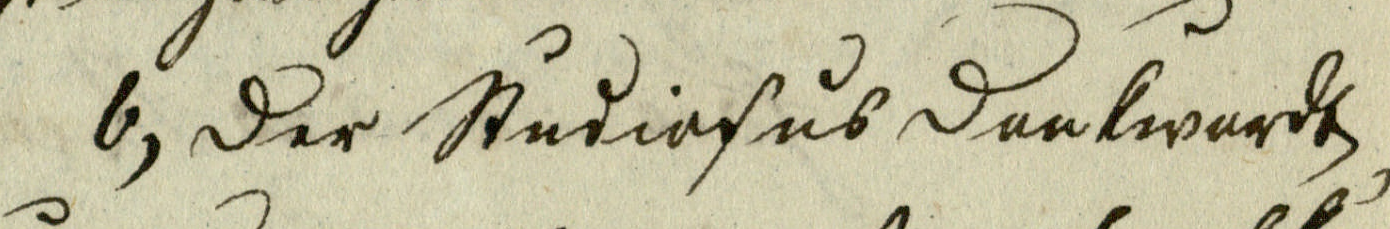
b, Der Studiosus Dankwardt
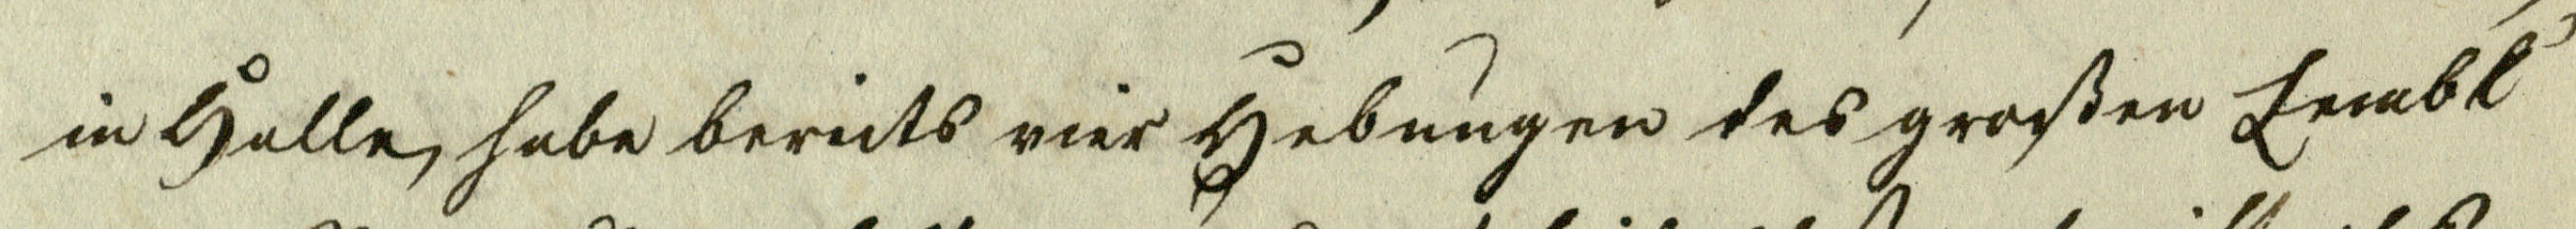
in Halle, habe bereits vier Hebungen des großen Lembk'
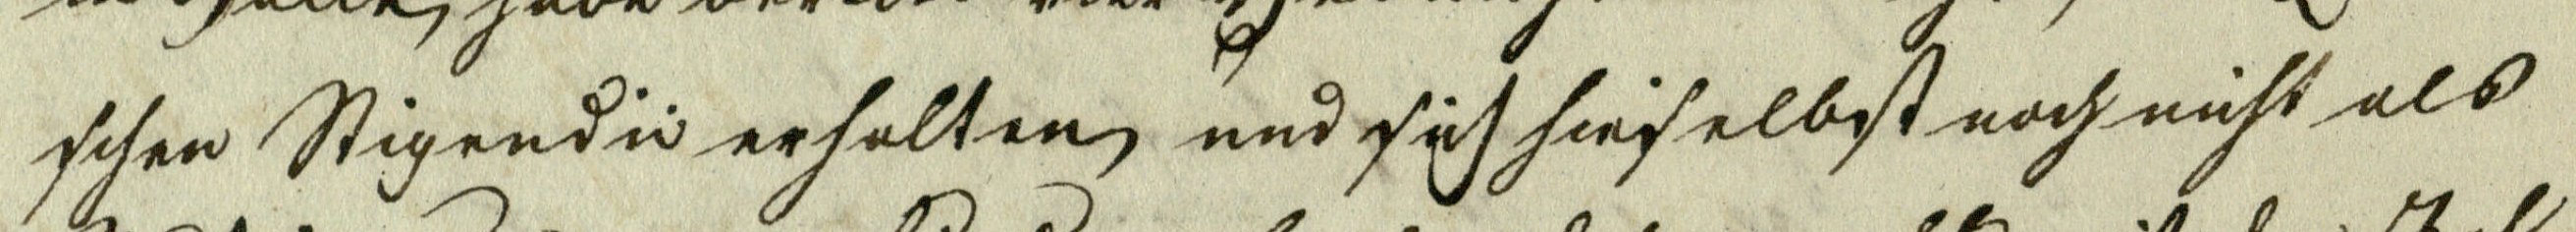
schen Stipendii erhalten und sich hieselbst noch nicht als
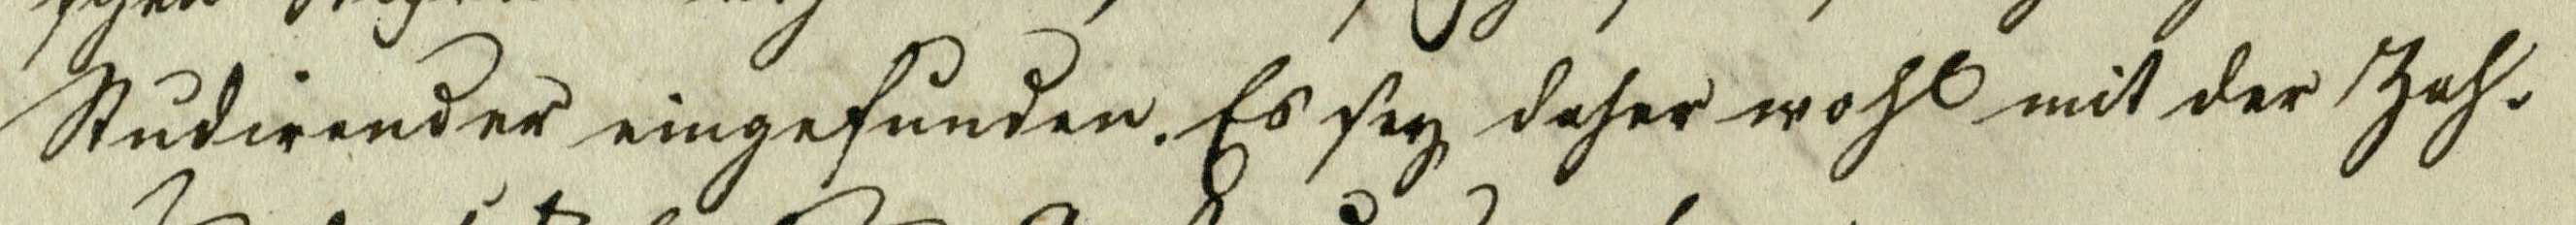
Studirender eingefunden. Es sey daher wohl mit der Zah¬
